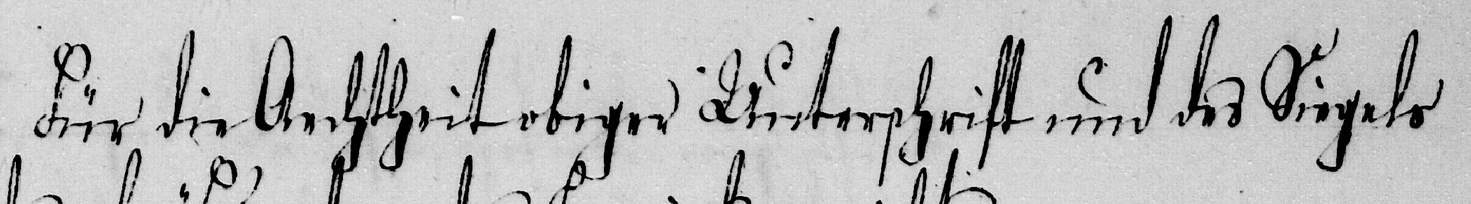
Für die Aechtheit obiger Unterschrift und des Siegels
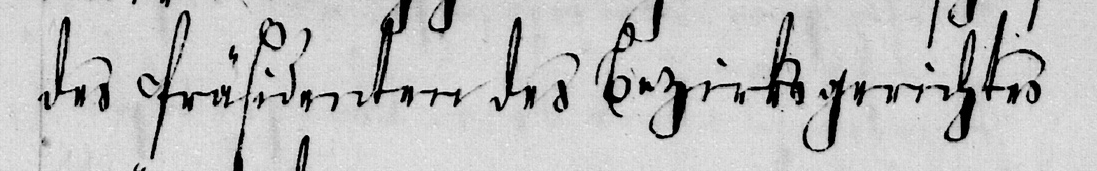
des Präsidenten des Bezirksgerichtes
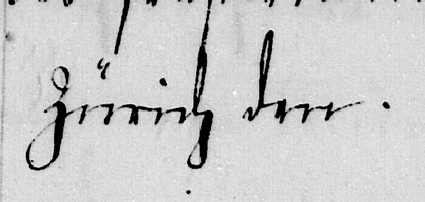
Zürich den …
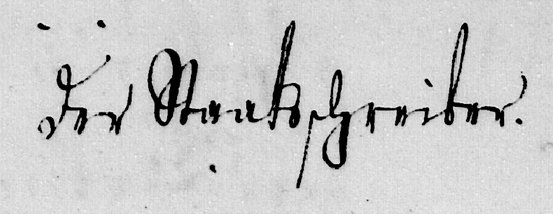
Der Staatsschreiber.
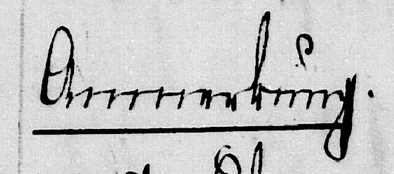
Anmerkung
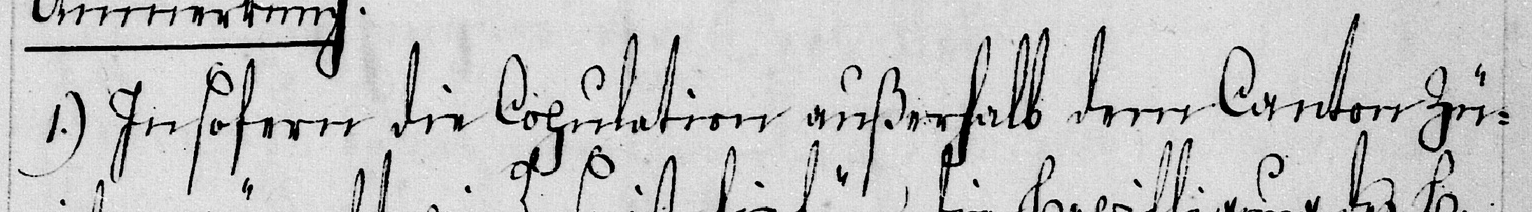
1.) Insofern die Copulation außerhalb dem Canton Zü¬
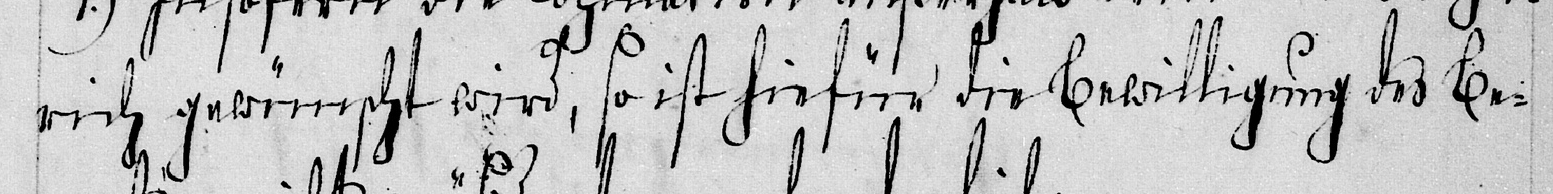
rich gewünscht wird, so ist hiefür die Bewilligung des Be¬
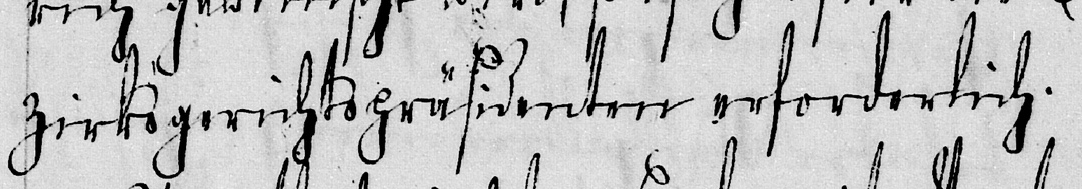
zirksgerichtspräsidenten erforderlich.
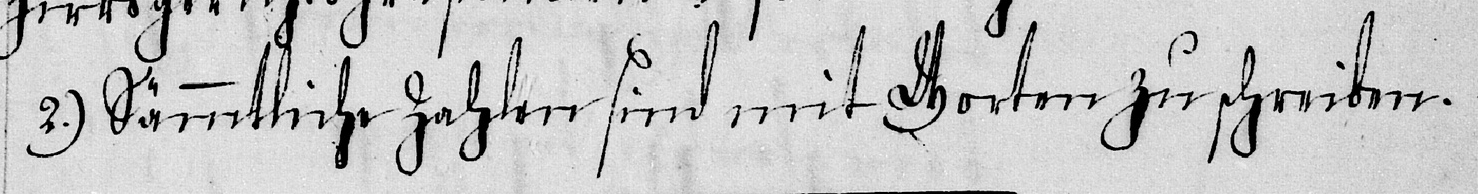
2.) Sämmtliche Zahlen sind mit Worten zu schreiben.
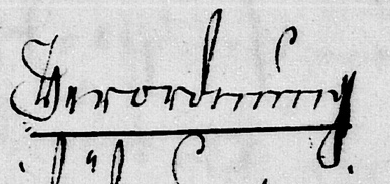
Verordnung
